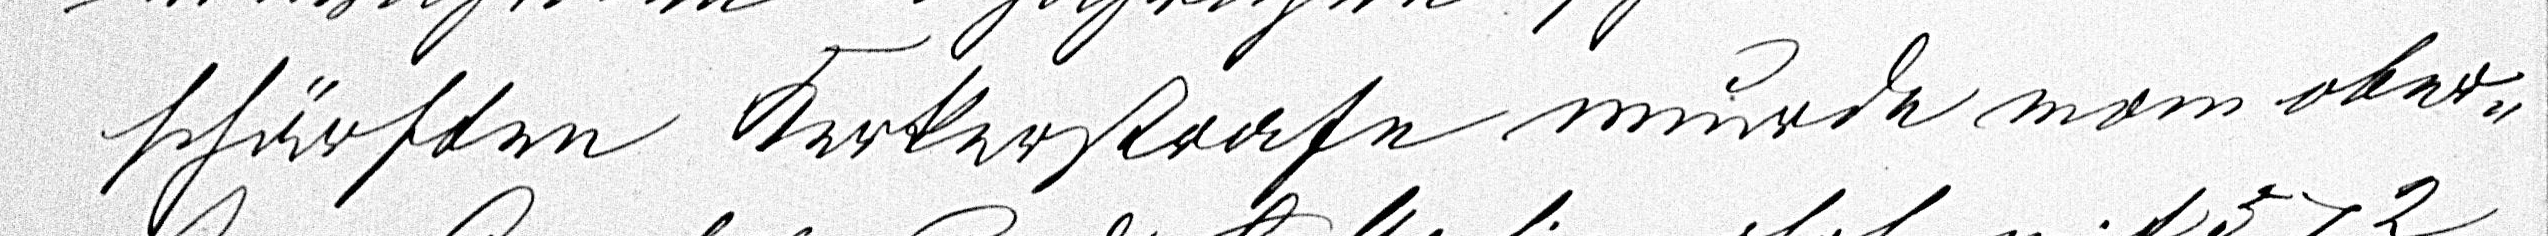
schärften Kerkerstrafe wurde mom ober¬
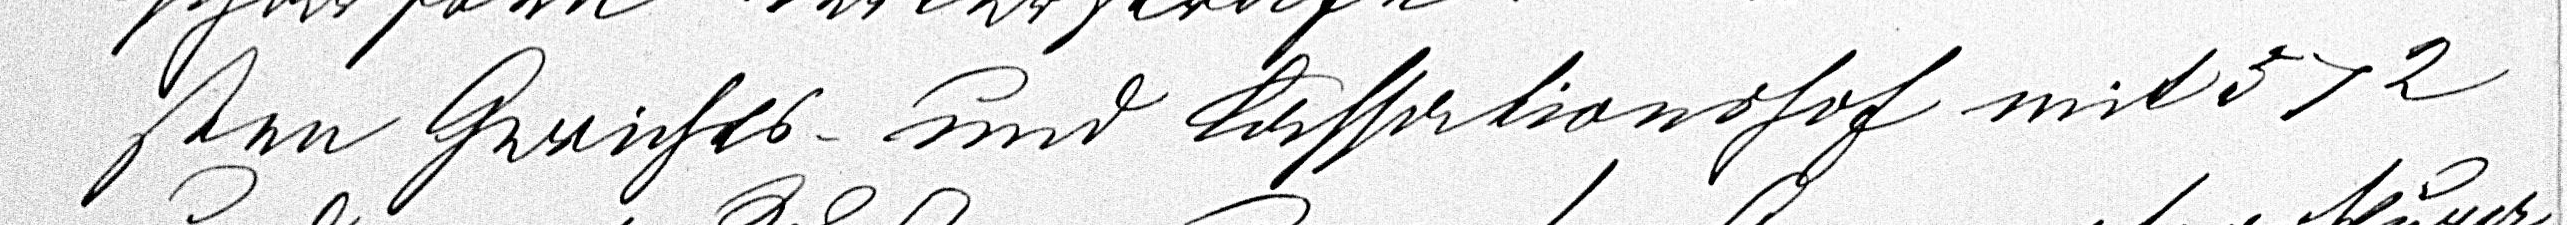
sten Gerichts- und Cassationshof mit 5>2
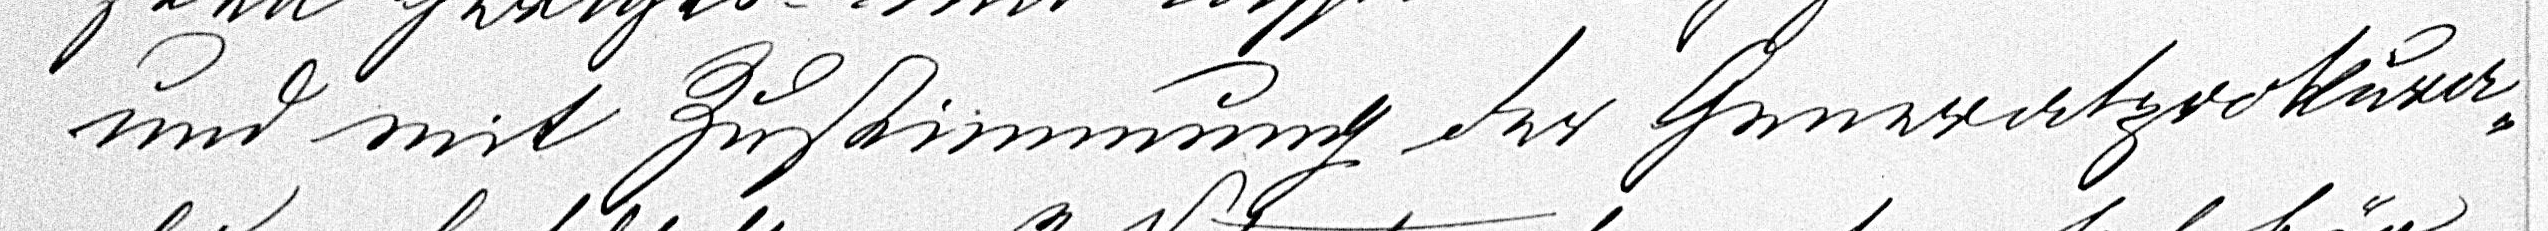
und mit Zustimmung der Generalprokura¬
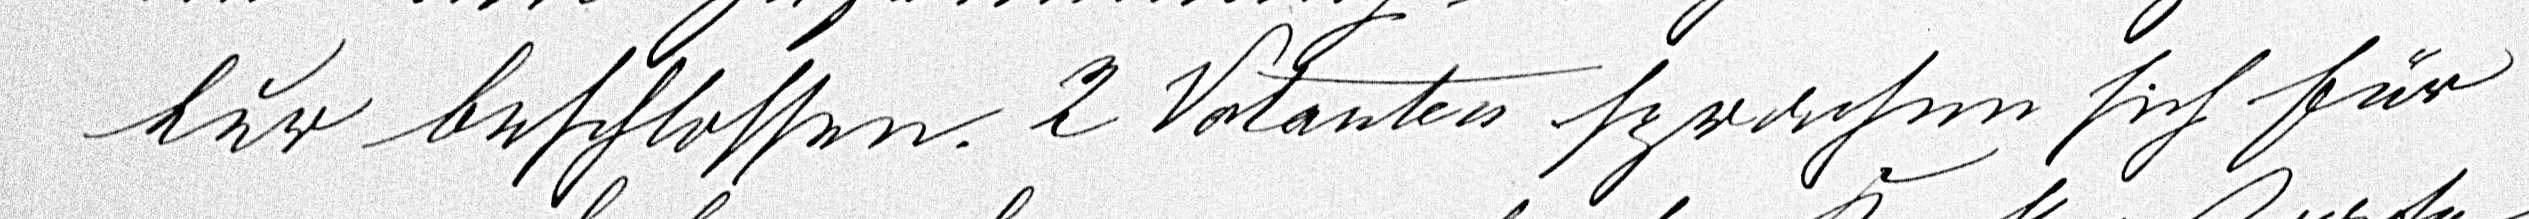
tur beschlossen. 2 Votanten sprachen sich für
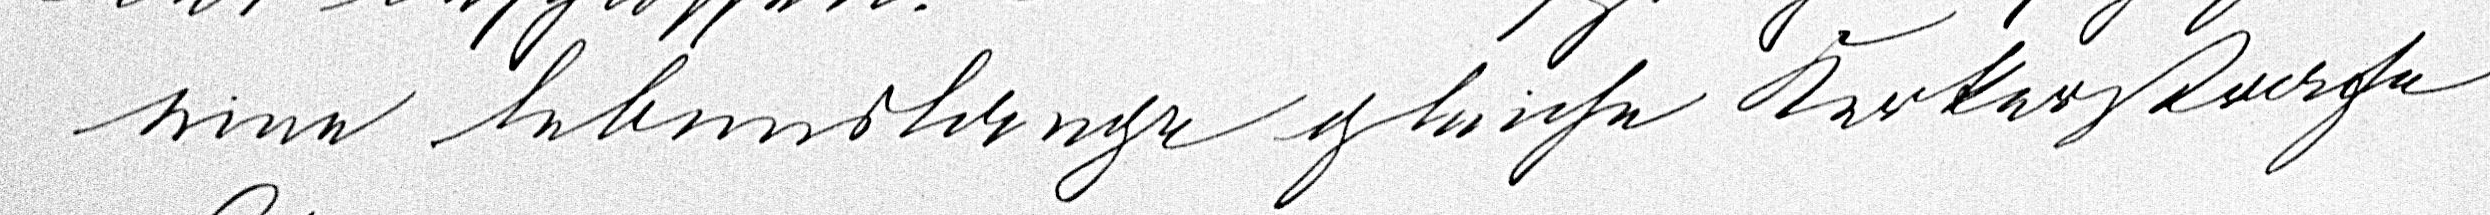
eine lebenslange gleiche Kerkerstrafe
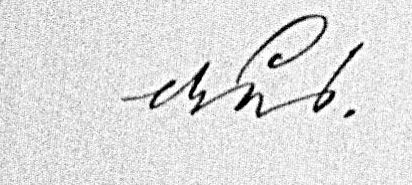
aus.
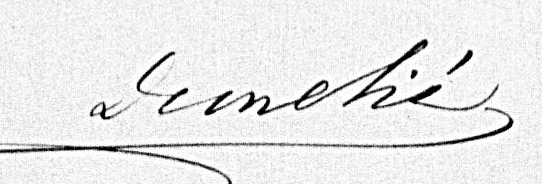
Demelić
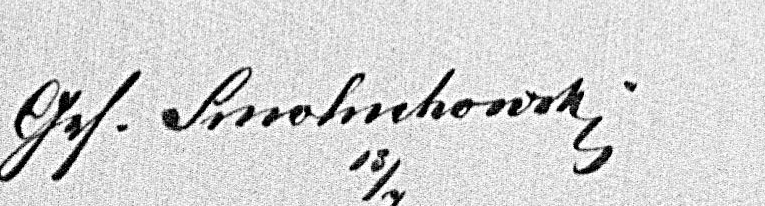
Ges. Smolnchowski
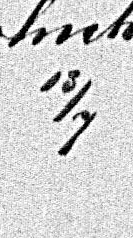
xx/7
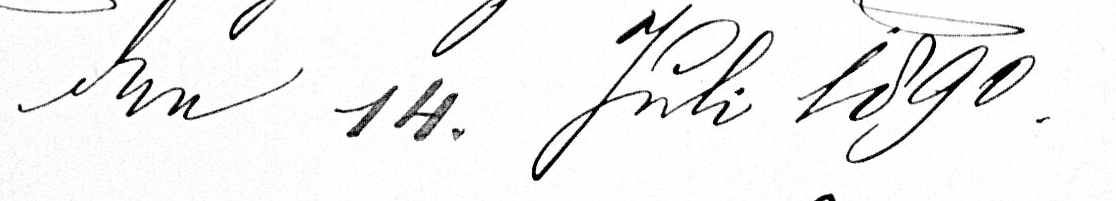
den 14. Juli 1890.
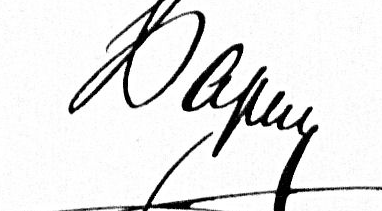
xx
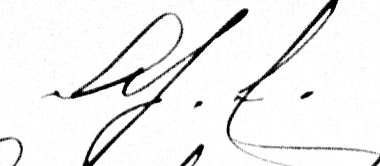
Ah. E.
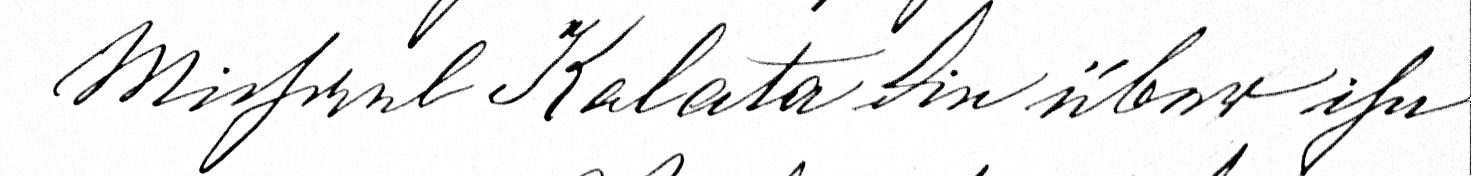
Michael Kalata die über ihn
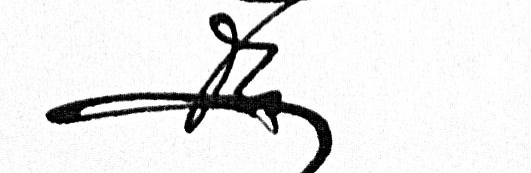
xx
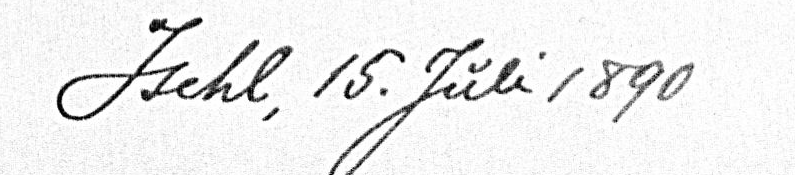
Ischl, 15. Juli 1890
